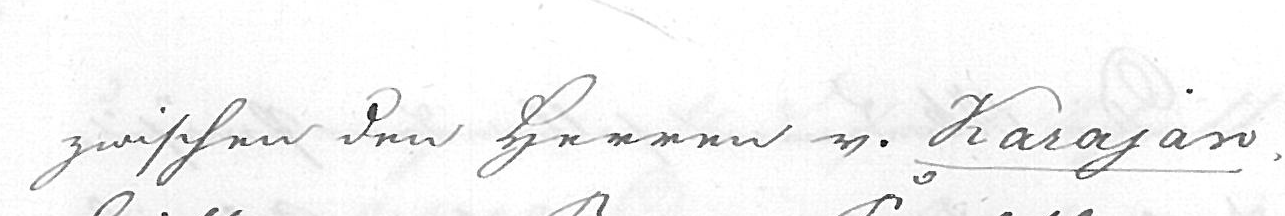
zwischen den Herren v. Karajan,
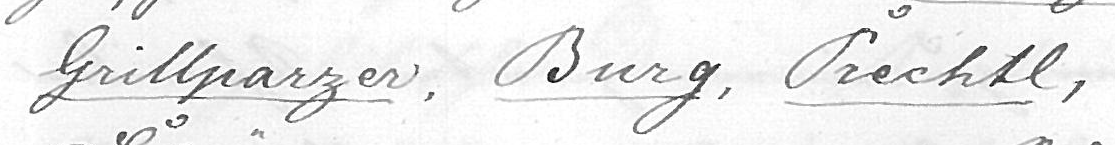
Grillparzer, Burg, Prechtl,
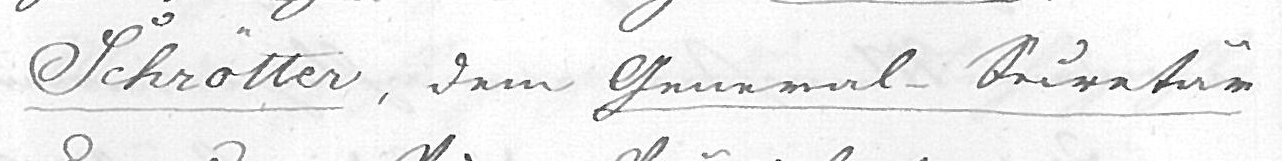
Schrötter, dem General-Secretär
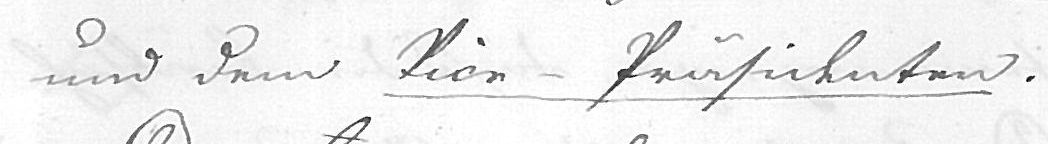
und dem Vice-Präsidenten.
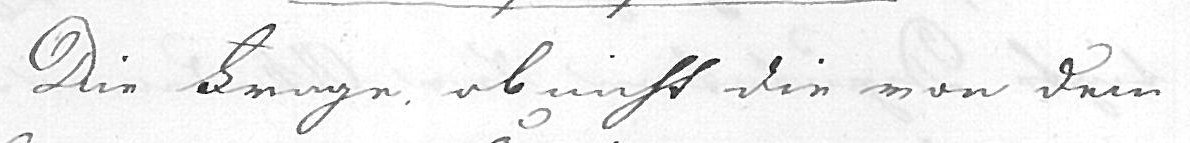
Die Frage, ob nicht die von dem
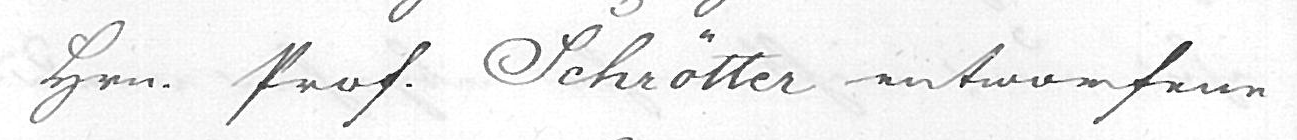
Hrn. Prof. Schrötter entworfene
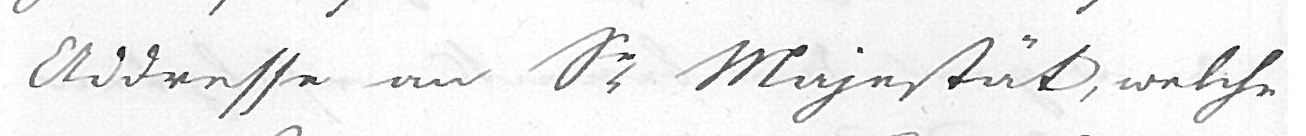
Adresse an Sr. Majestät, welche
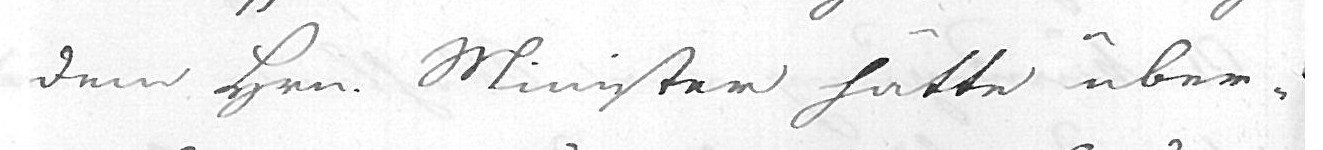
dem Hrn. Minister hätte über-
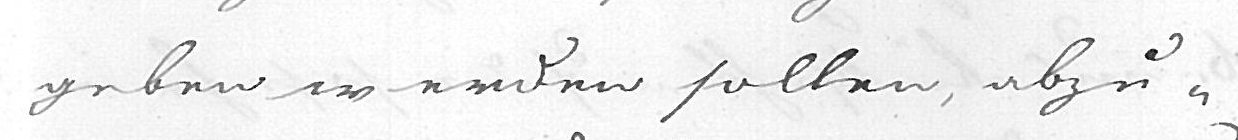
geben werden sollen, abzu-
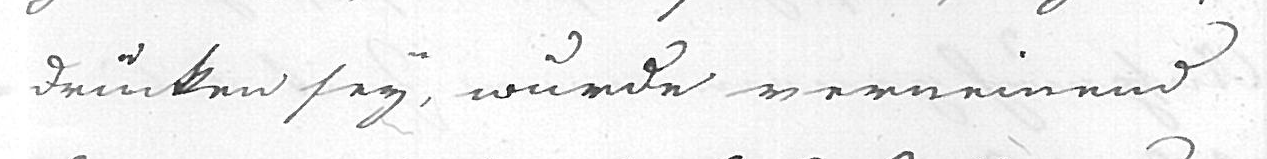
drucken sey, wurde verneinend
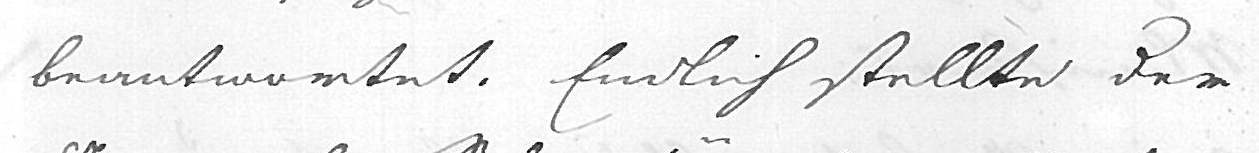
beantwortet. Endlich stellte der
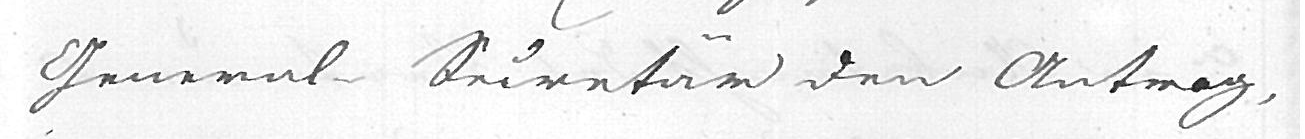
General-Secretär den Antrag,
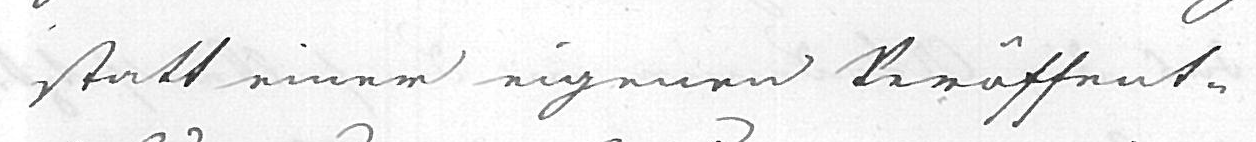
statt einer eigenen Veröffent-
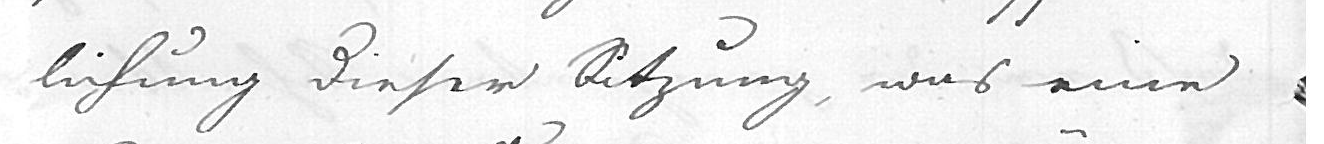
lichung dieser Sitzung, was eine
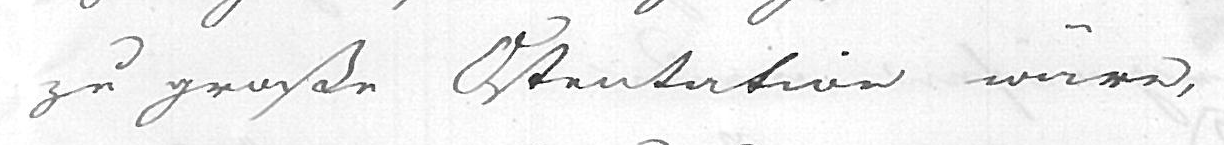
zu große Ostentation wäre,
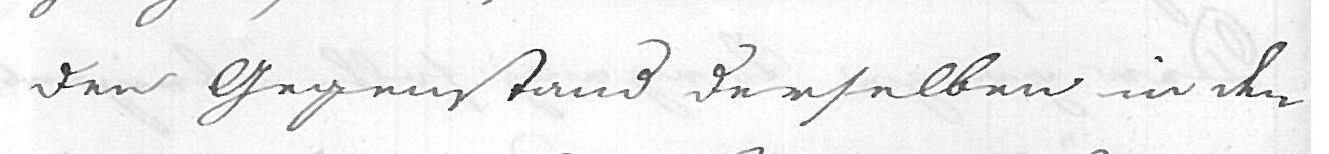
den Gegenstand derselben in der
